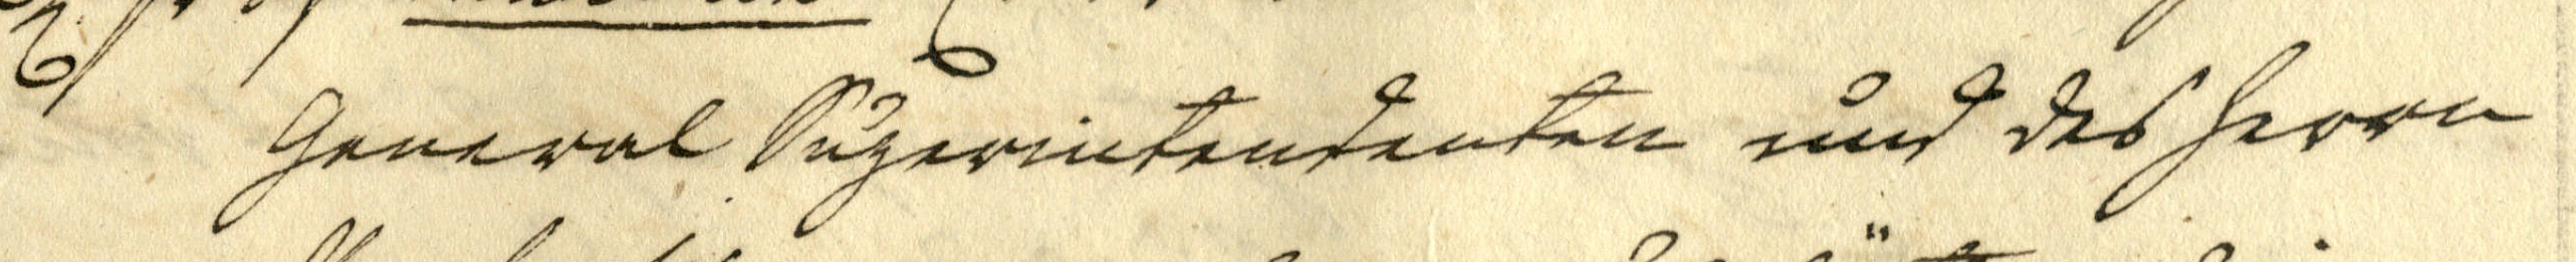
General Superintendenten und des Herrn
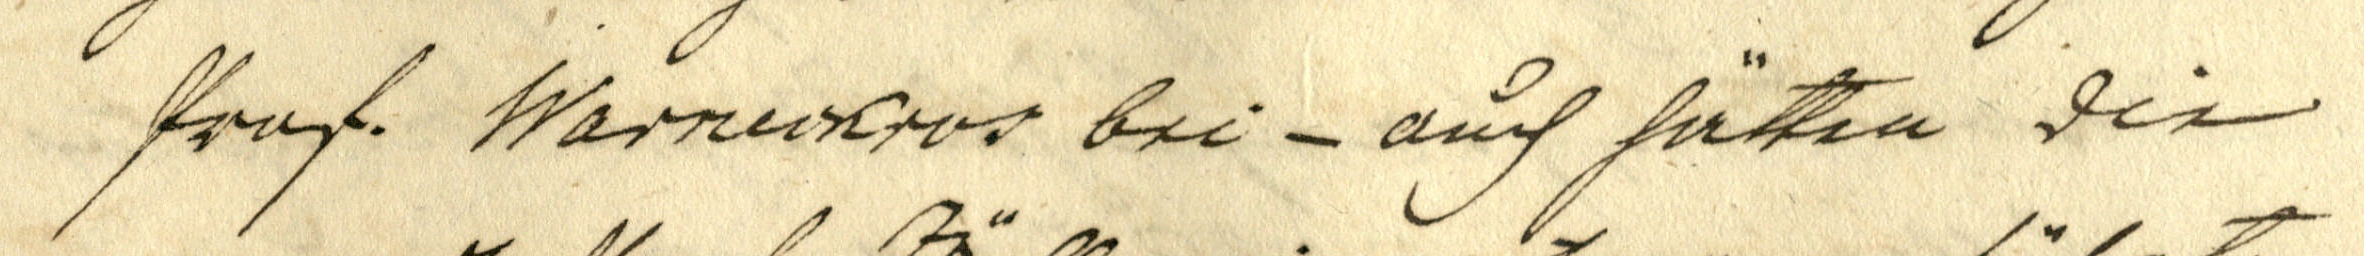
Prof. Warneckros bei - auch hätten die
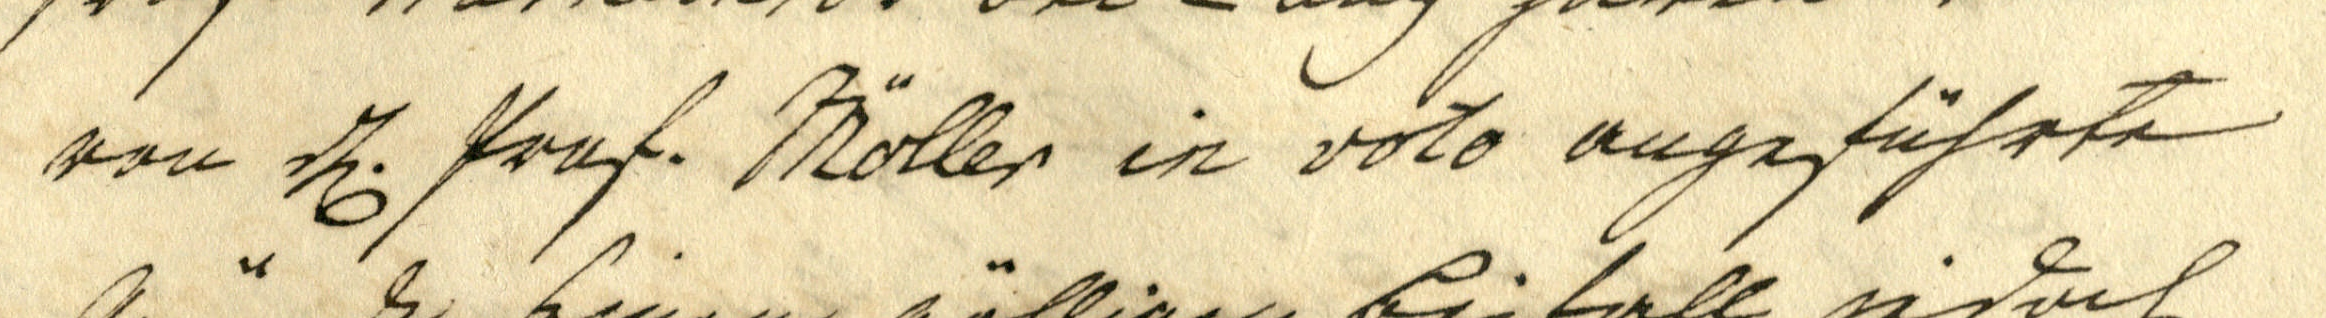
von dh. Prof. Möller in voto angeführte
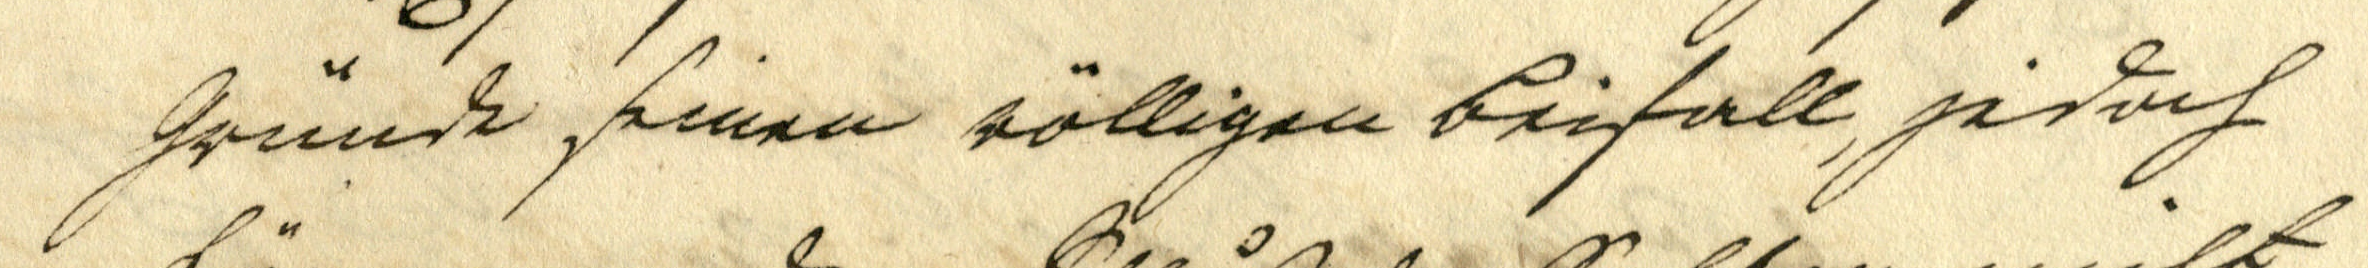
Gründe seinen völligen Beifall, jedoch
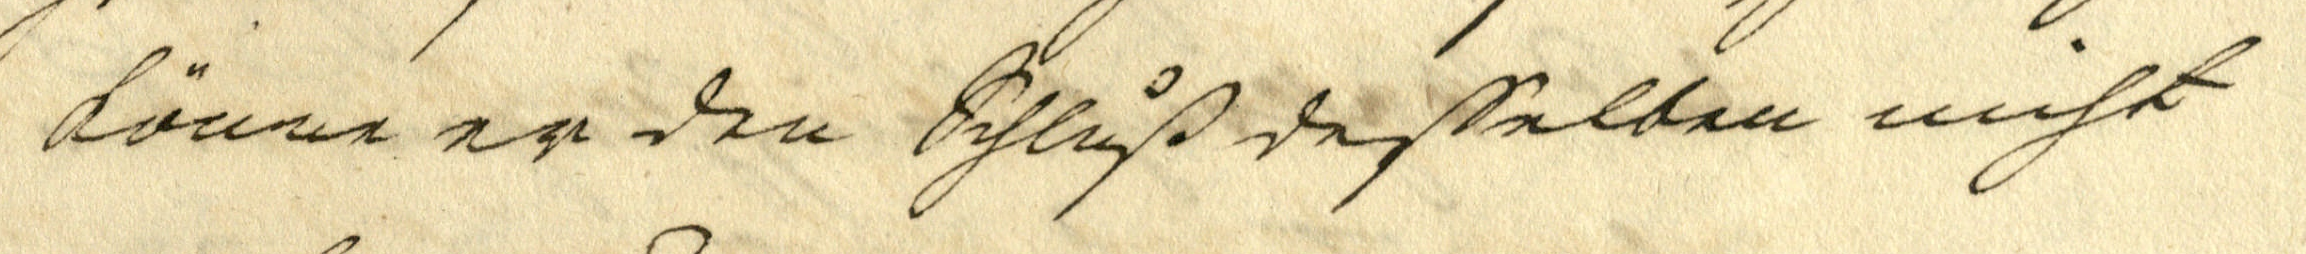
könne er den Schluß desselben nicht
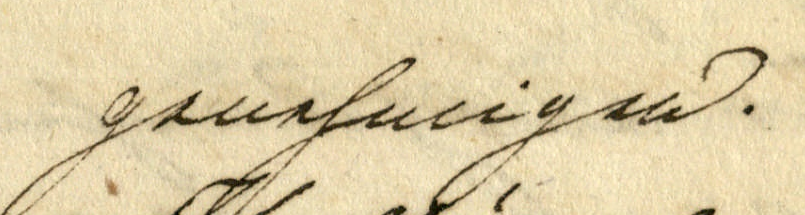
genehmigen.
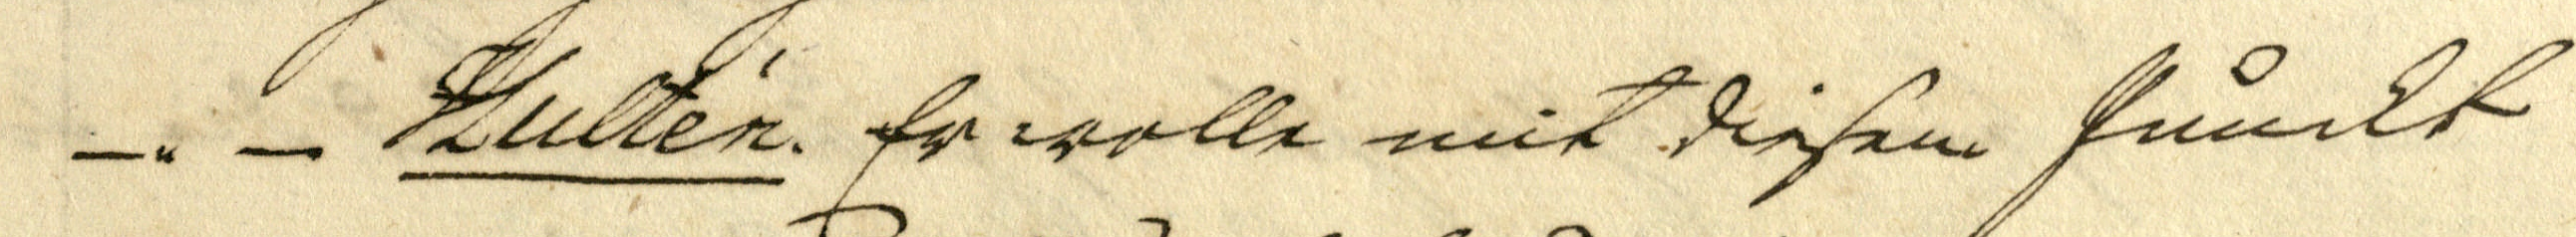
Hultén. Er wolle mit diesem Punckt
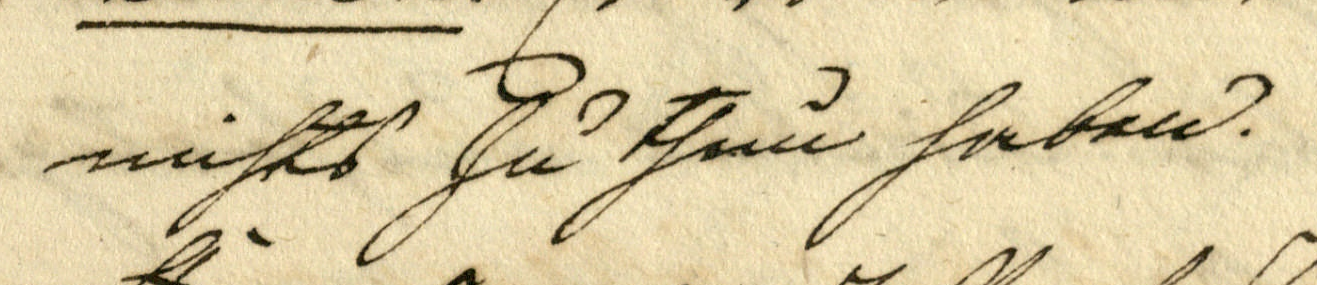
nichts zu thun haben.
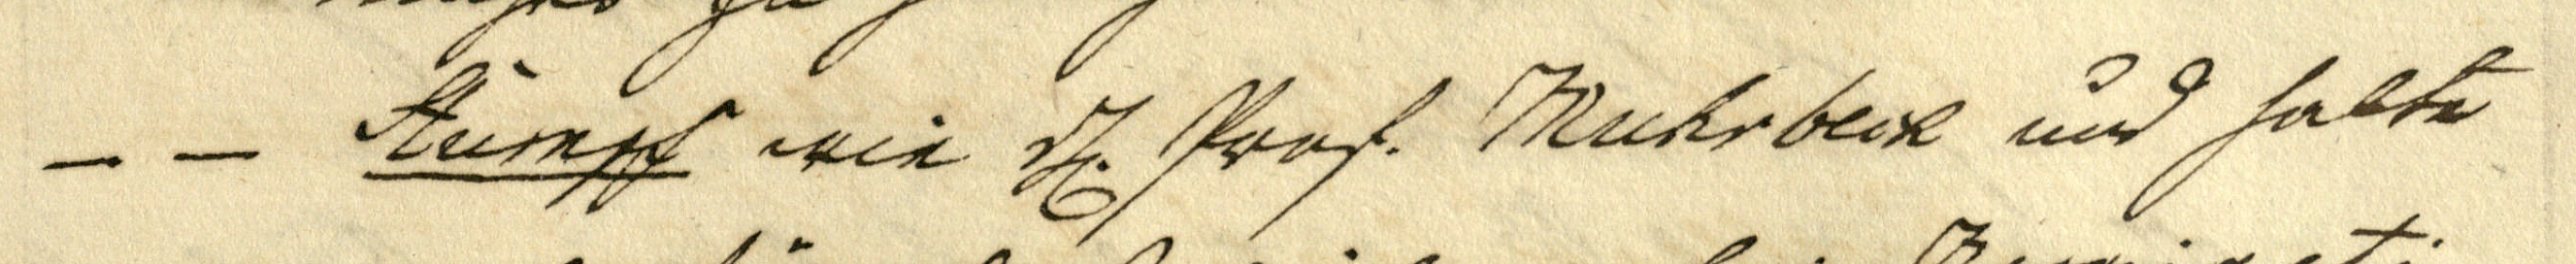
Stumpf wie dh. Prof. Muhrbeck und halte
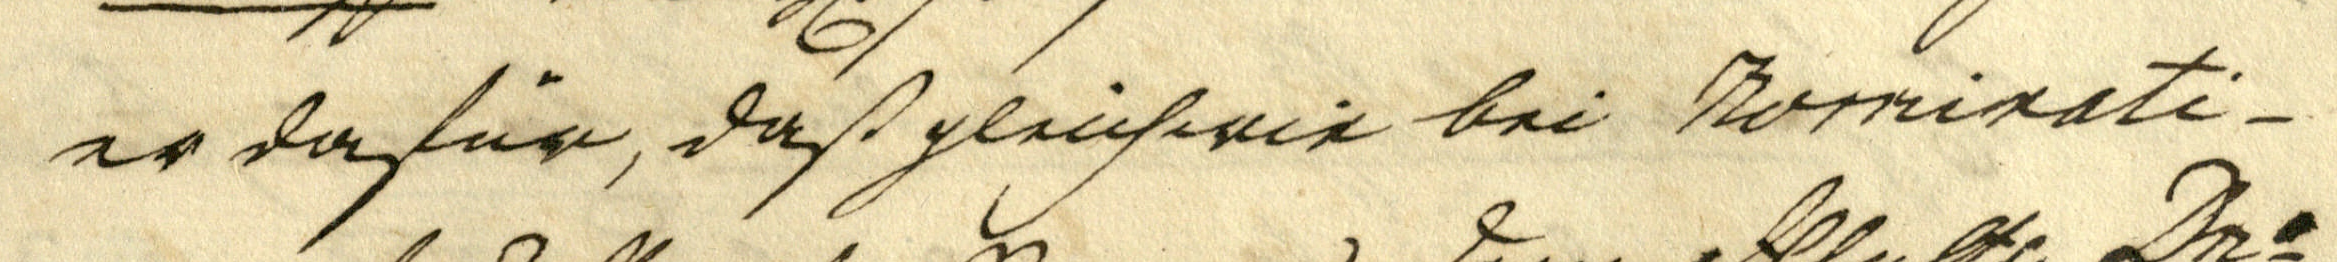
er dafür, daß gleichwie bei Nominati¬
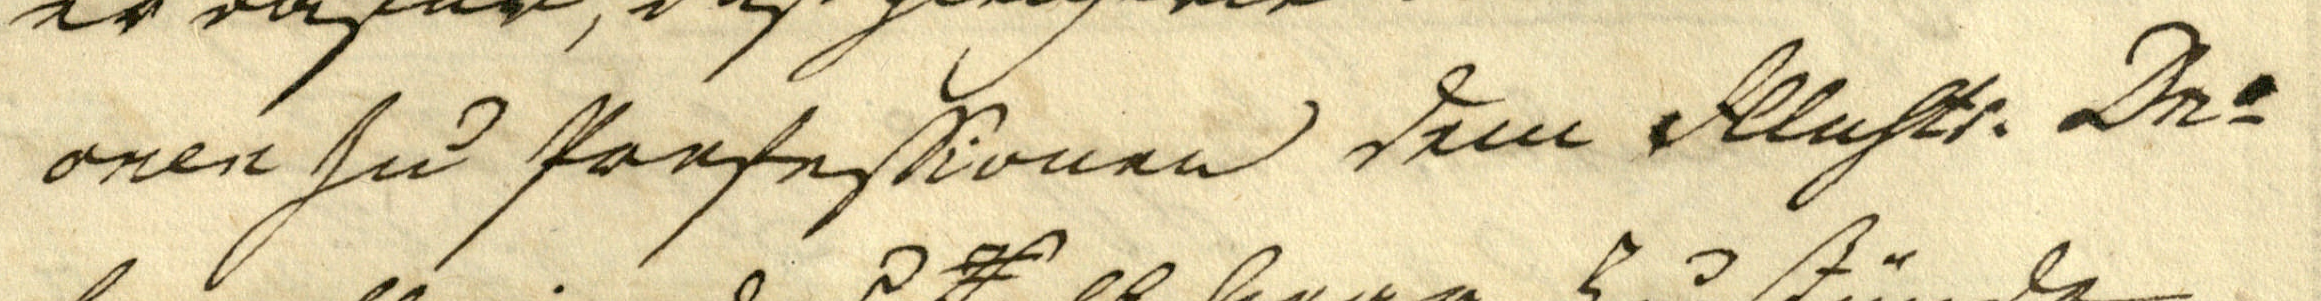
onen zu Professionen dem Illustr. Dn.
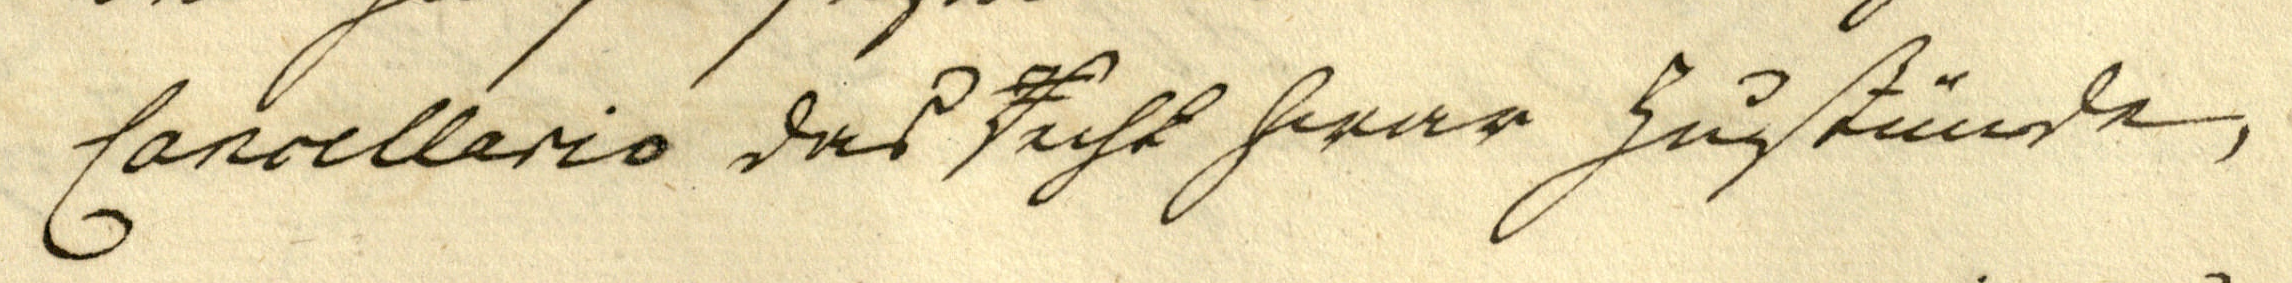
Cancellario das Recht zwar zustünde,
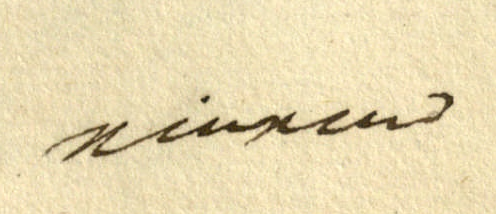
einen
